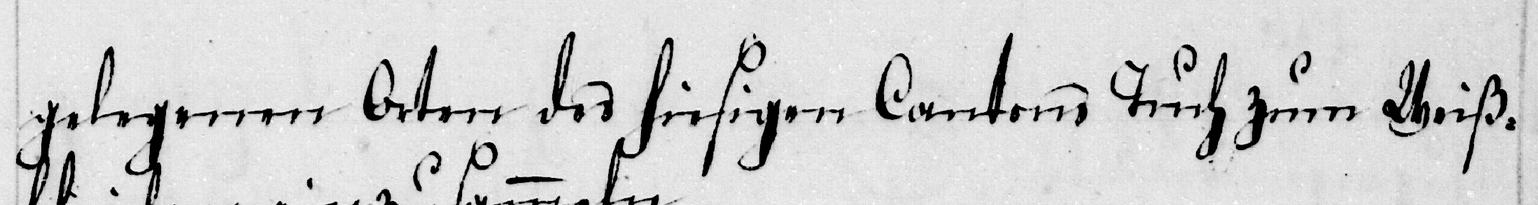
gelegenen Orten des hiesigen Cantons Tuch zum Weiß¬
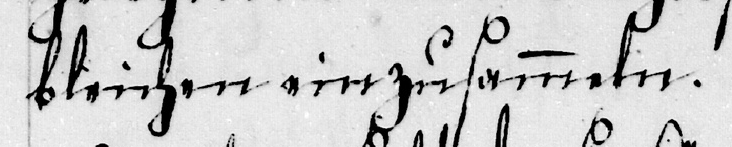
bleichen einzusammeln.
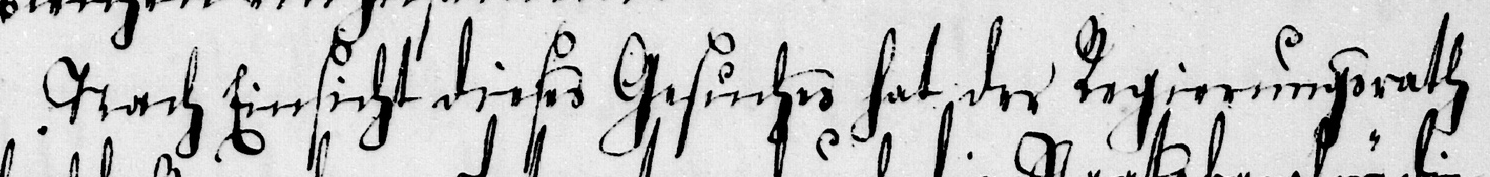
Nach Einsicht dieses Gesuches hat der Regierungsrath
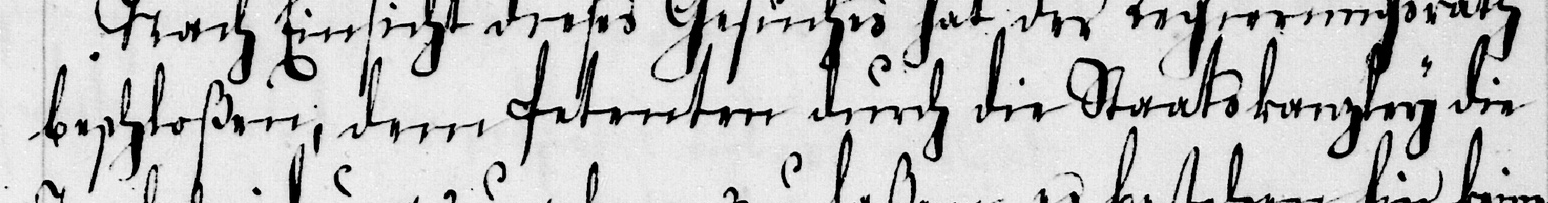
beschloßen, dem Petenten durch die Staatskanzley die
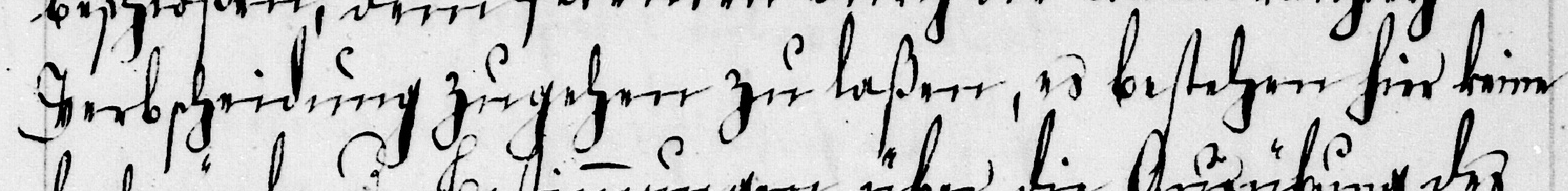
Verbscheidung zugehen zu laßen, es bestehen hier keine
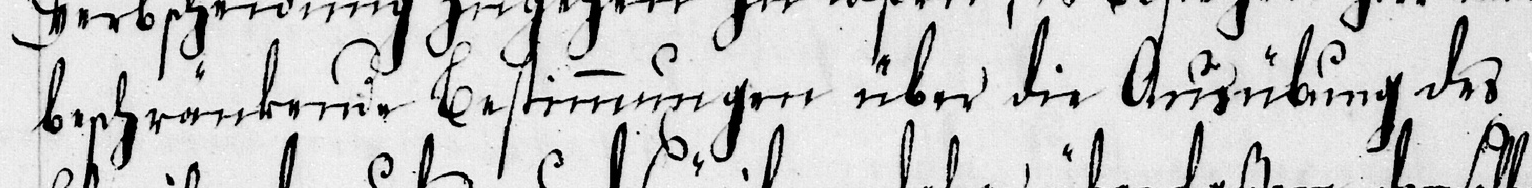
beschränkende Bestimmungen über die Ausübung des
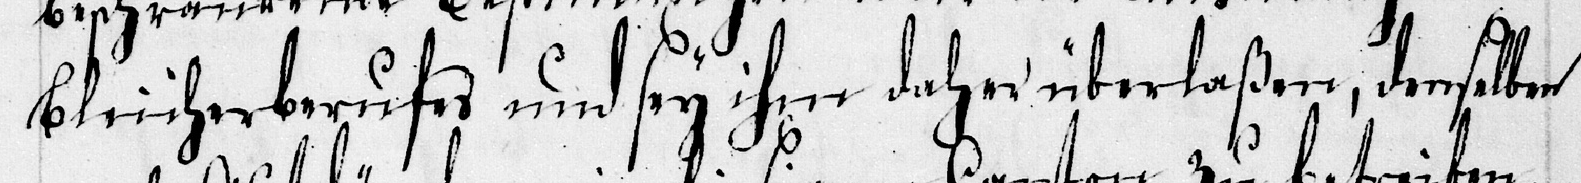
Bleicherberufes und sey ihm daher überlaßen, denselben
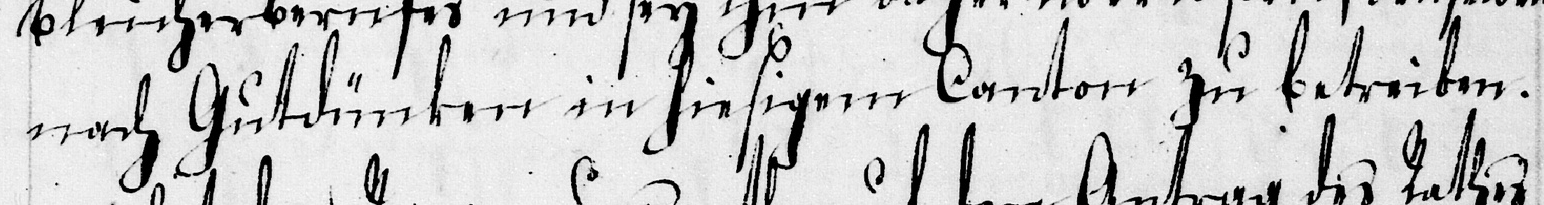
nach Gutdünken in hiesigem Canton zu betreiben.
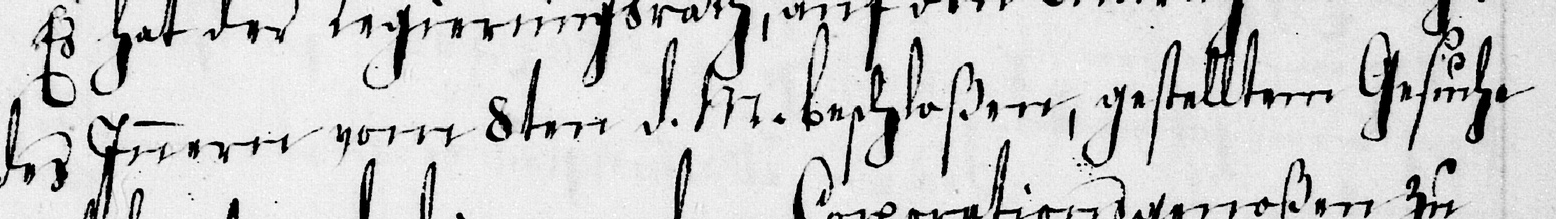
des Innern vom 8ten d. M. beschloßen, gestelltem Gesuche
